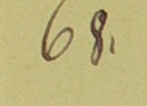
68
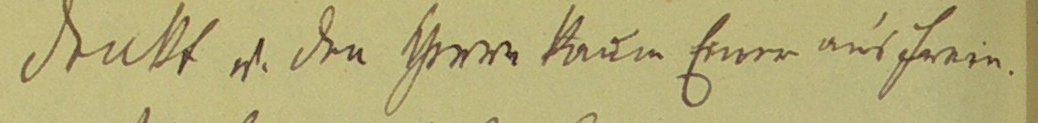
Denkt von den Herrn kaum Einer an`s herein??
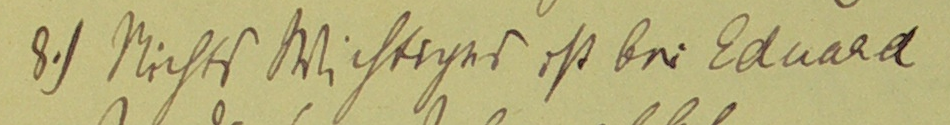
8) Nichts Wichtiges ist bei Eduard
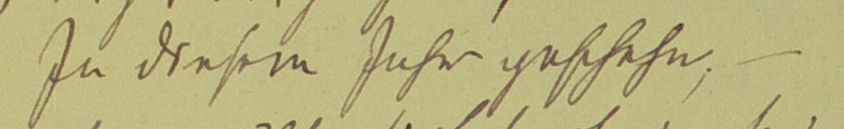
In diesem Jahr geschehen. -
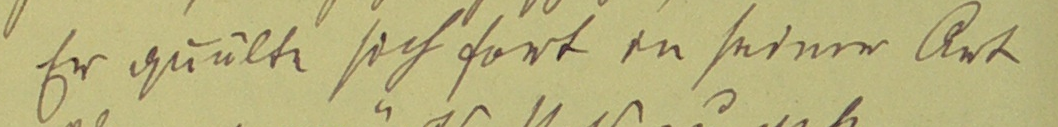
Er quält sich fort in seiner Art
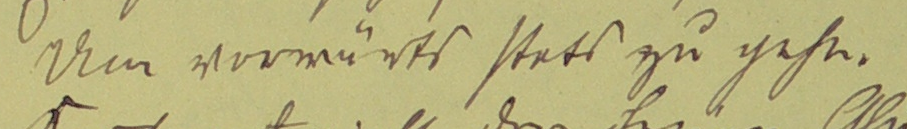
Um vorwärts steht stets zu gehen.
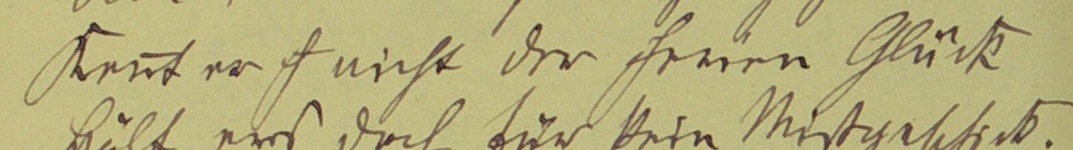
Kent er ??? nicht der Horen Glück
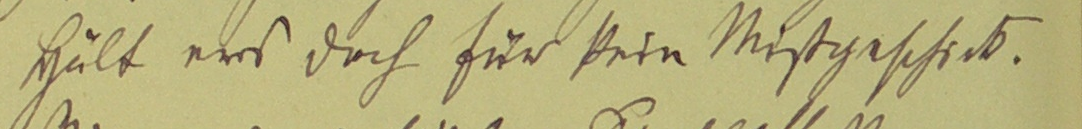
Hält ers doch für kein Mißgeschick.
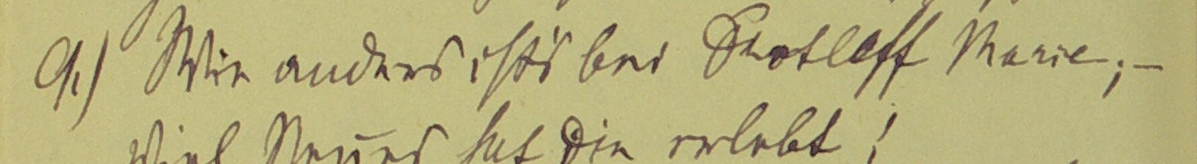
9) Wie anders ist`s bei Drotleff Marie
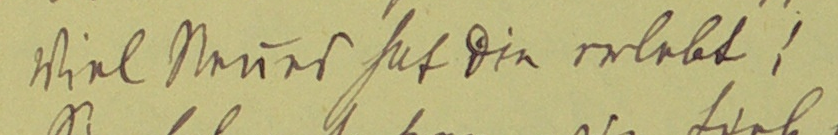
Viel Neues hat die erlebt !
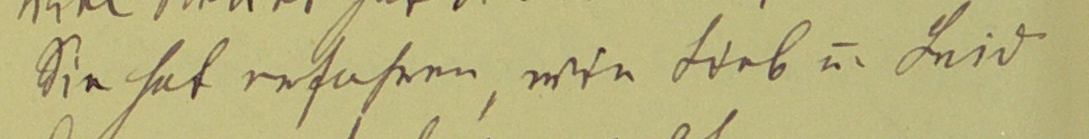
Sie hat erfahrn, wie Leib und Leid
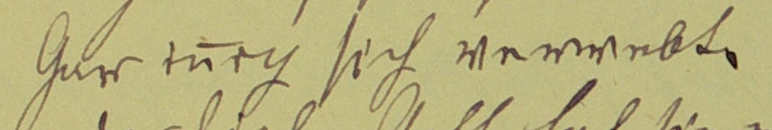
Gar innig sich verwebt
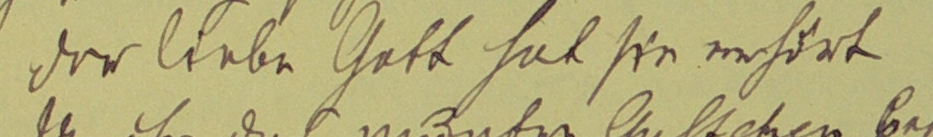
Der liebe Gott hat sie erhört
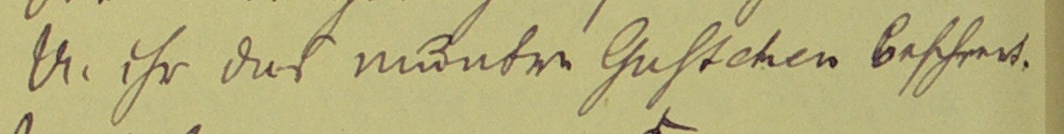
U. ihr das muntre Gustchen beschert.
